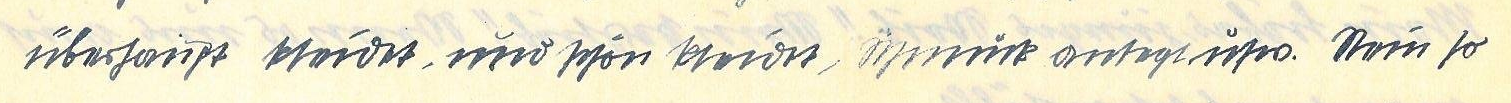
überhaupt kleidet, und schön kleidet, Schmuck anlegt usw. Nein, so
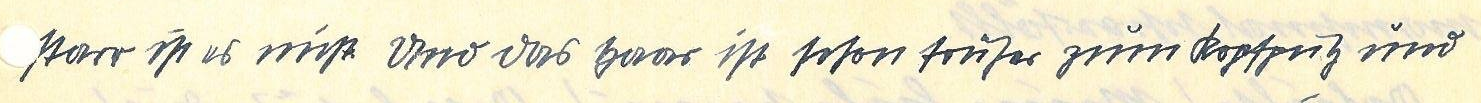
starr ist er nicht. Und das Haar ist schon früher zum Kopfputz und
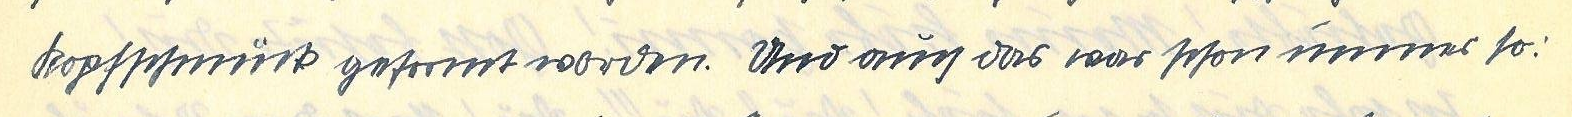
Kopfschmuck geformt worden. Und auch das war schon immer so:
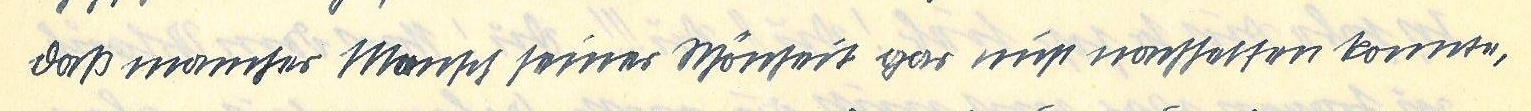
daß mancher Mensch seiner Schönheit gar nicht nachlassen konnte,
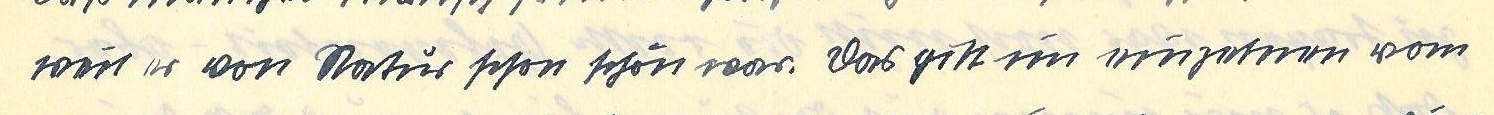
weil er von Natur schon schön war. Das gilt im einzelnen vom
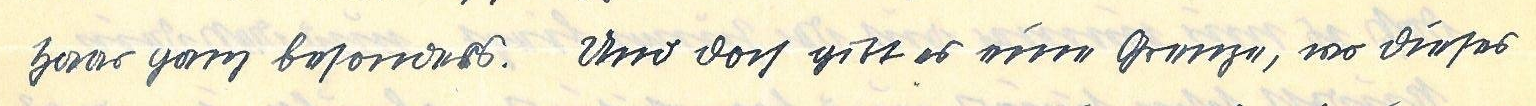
Haar ganz besonders. Und doch gibt es eine Grenze, wo dieses
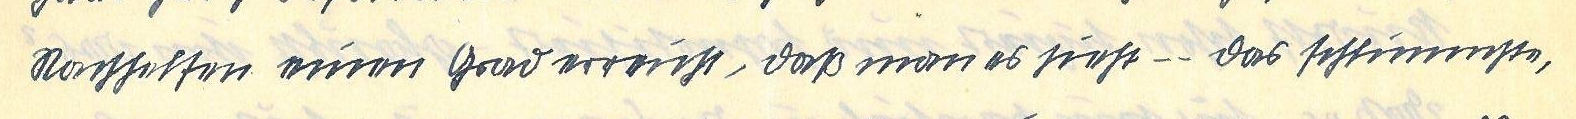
Nachhelfen einen Grad erreicht, daß man es sieht – – das schlimmste,
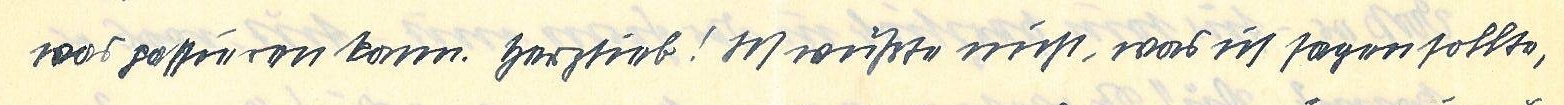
was passieren kann. Herzlieb! Ich wüßte nicht, was ich sagen sollte,
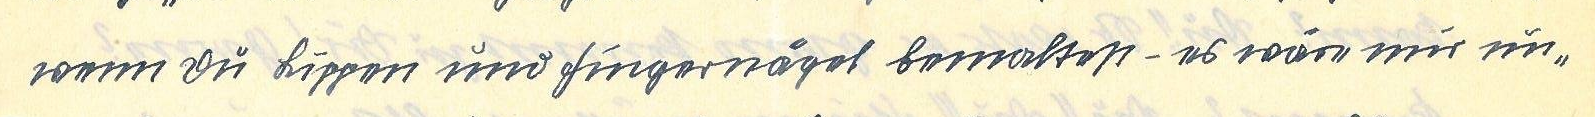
wenn Du Lippen und Fingernägel bemaltest – es wäre mir un¬
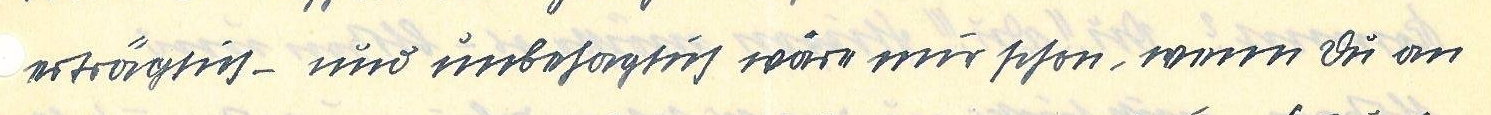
erträglich – und unbehaglich wäre mir schon, wenn Du an
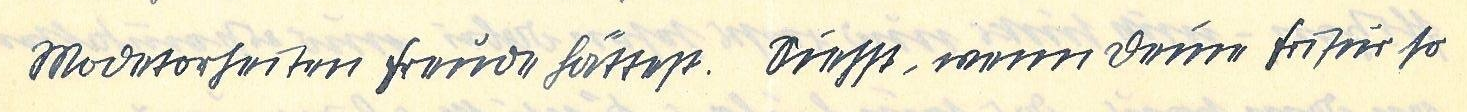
Modetorheiten Freude hättest. Siehst, wenn Deine Frisur so
